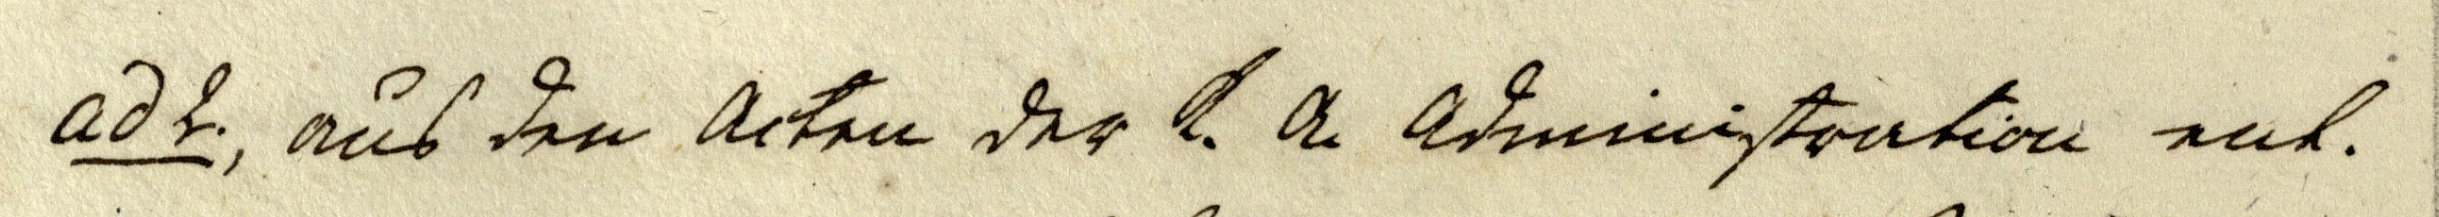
ad 2., aus den Acten der K. A. Administration ent¬
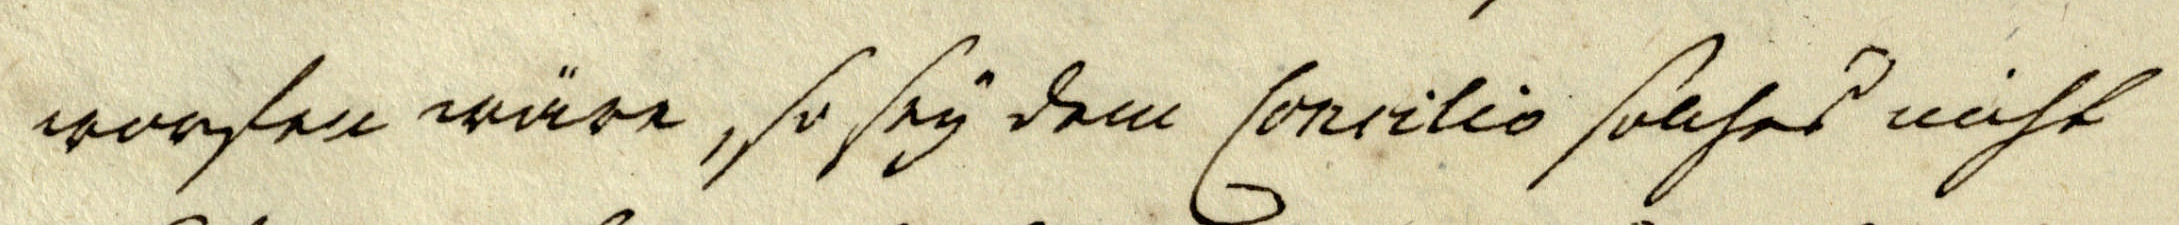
worfen wäre, so seÿ dem Concilio solches nicht
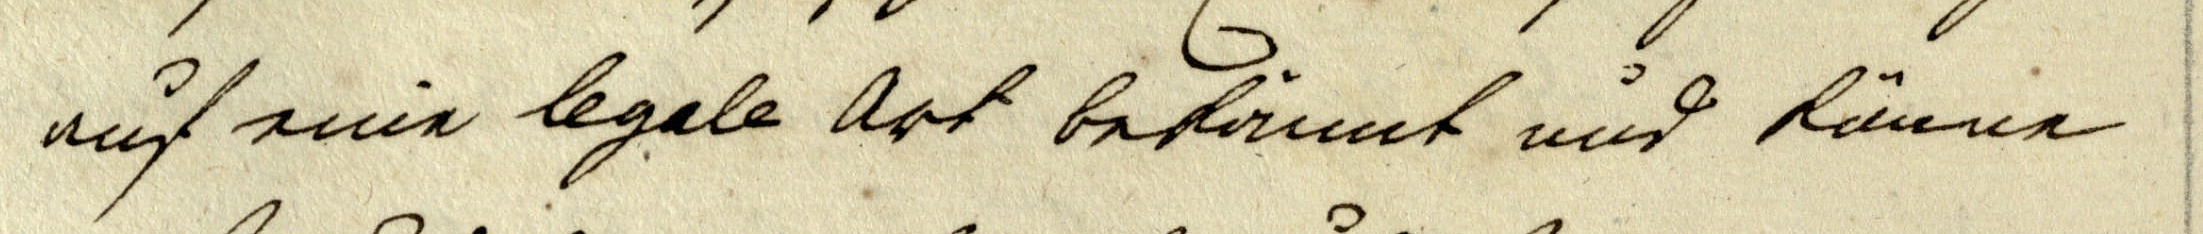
auf eine legale Art bekannt und könne
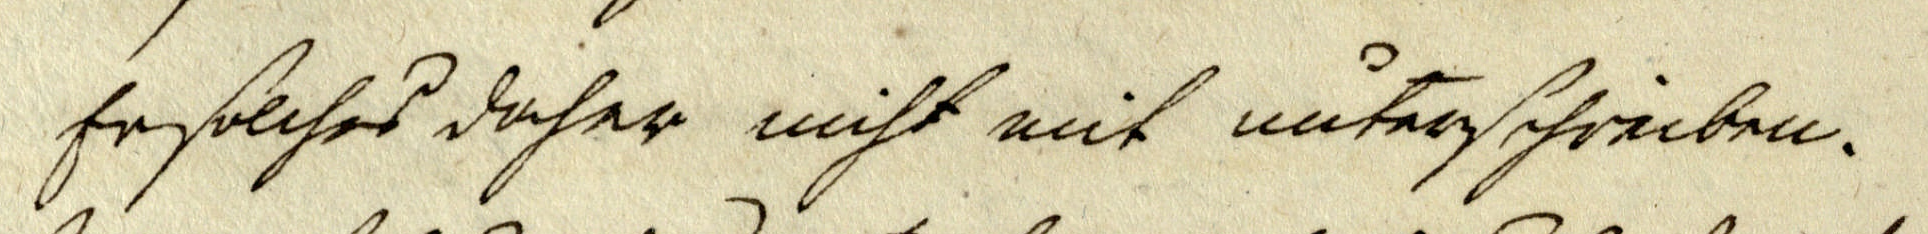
Er solches daher nicht mit unterschreiben.
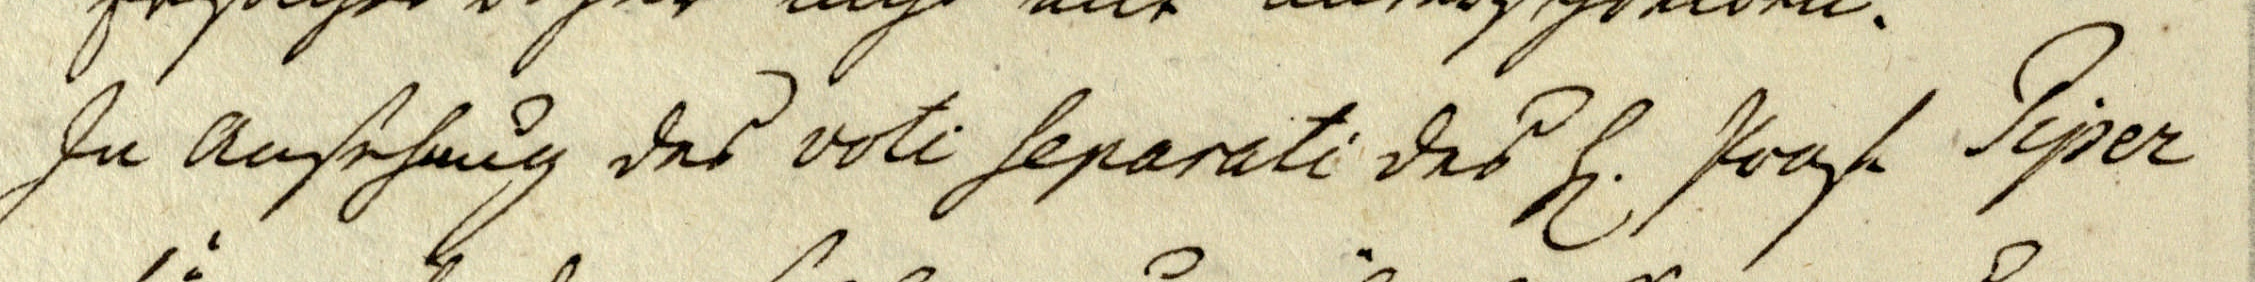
In Ansehung des voto separati des H. Prof. Piper
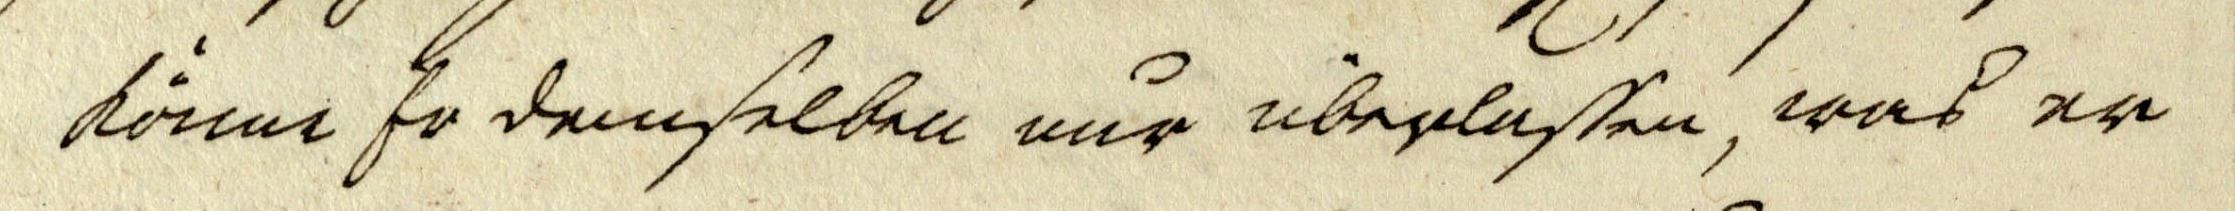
könne Er demselben nur überlassen, was er
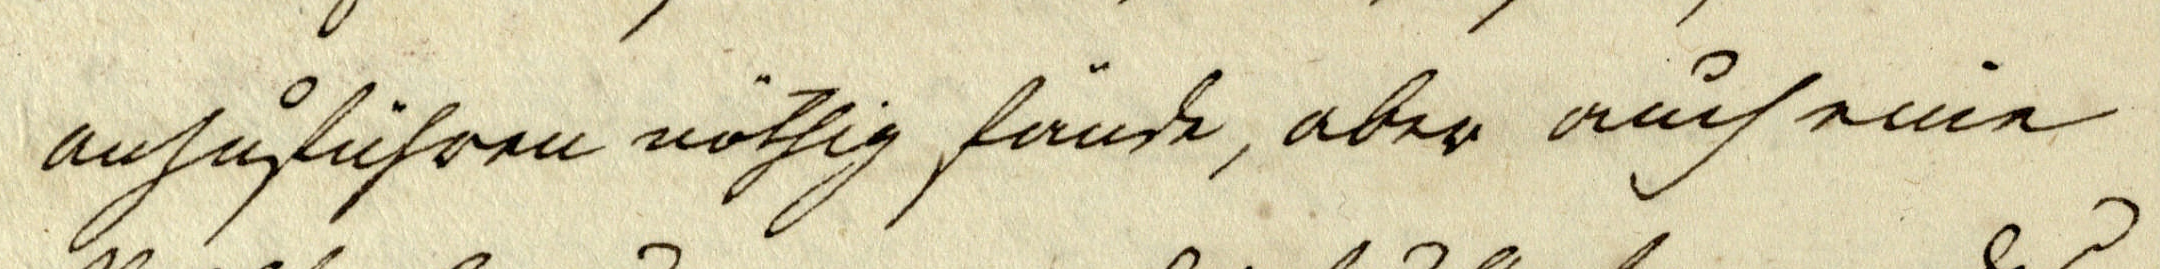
anzuführen nöthig fände, aber auch eine
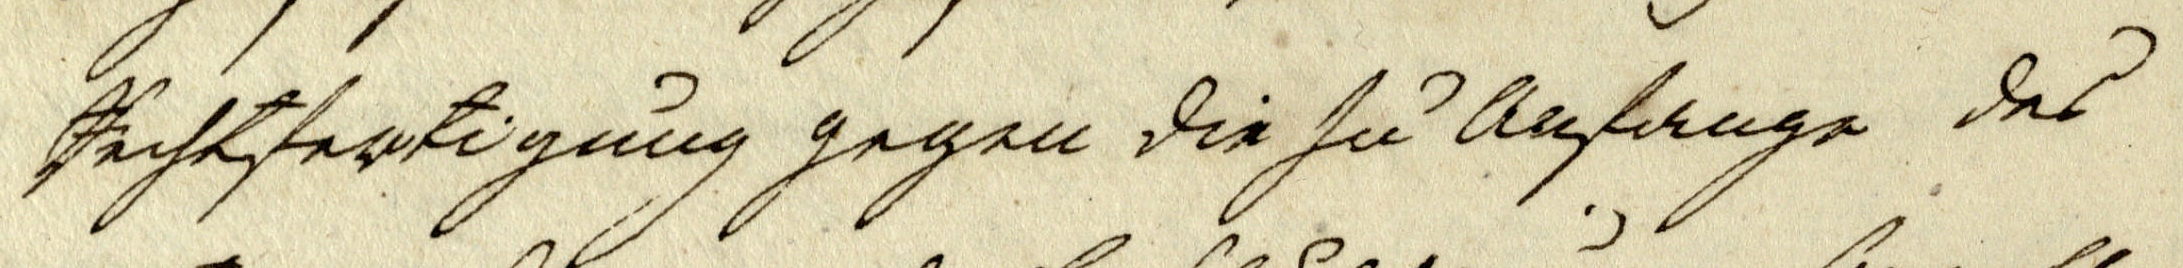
Rechtfertigung gegen die zu Anfange des
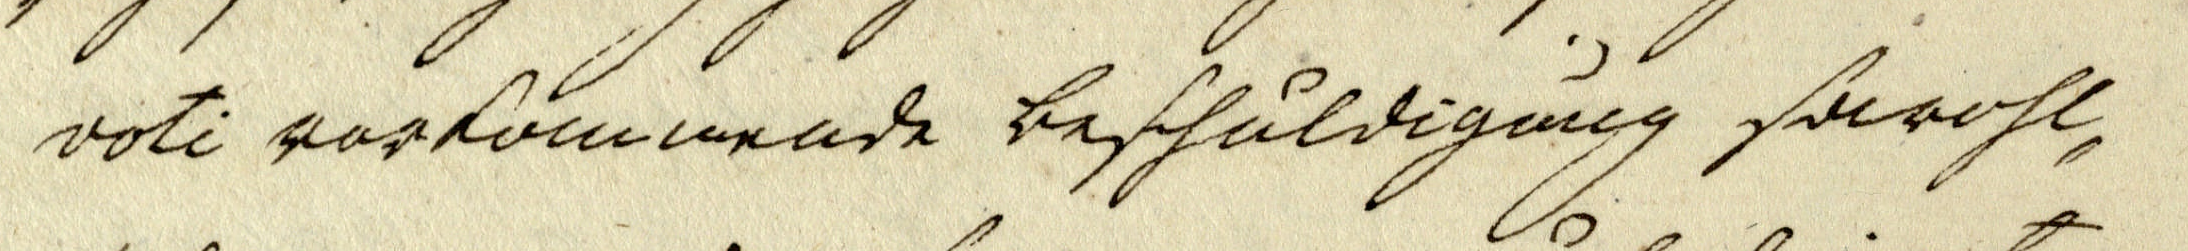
voti vorkommende Beschuldigung sowohl,
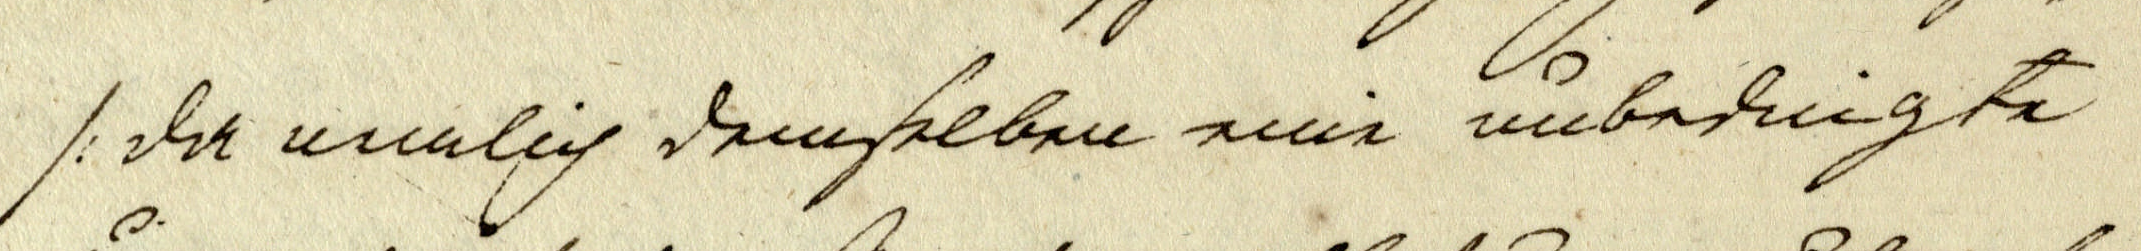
/: da nemlich demselben eine unbedingte
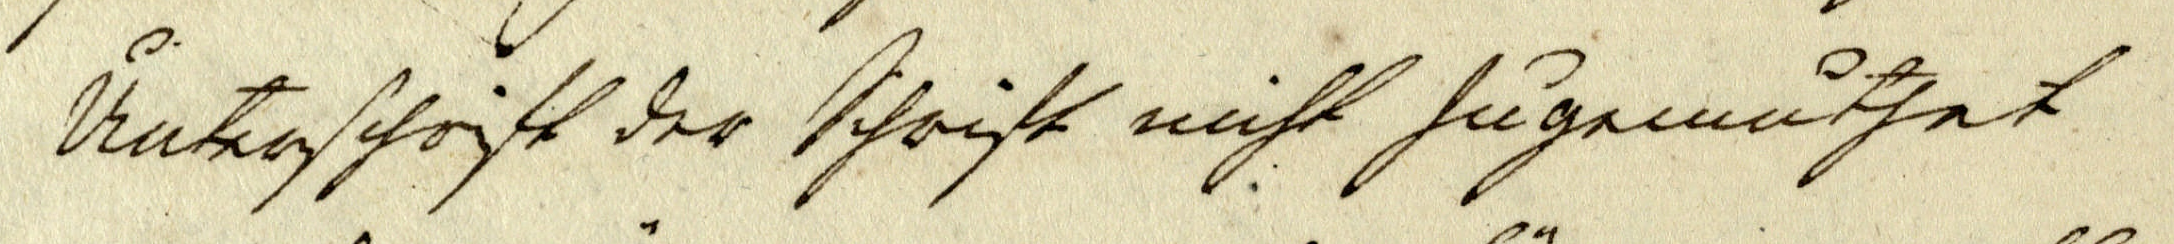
Unterschrift der Schrift nicht zugemuthet
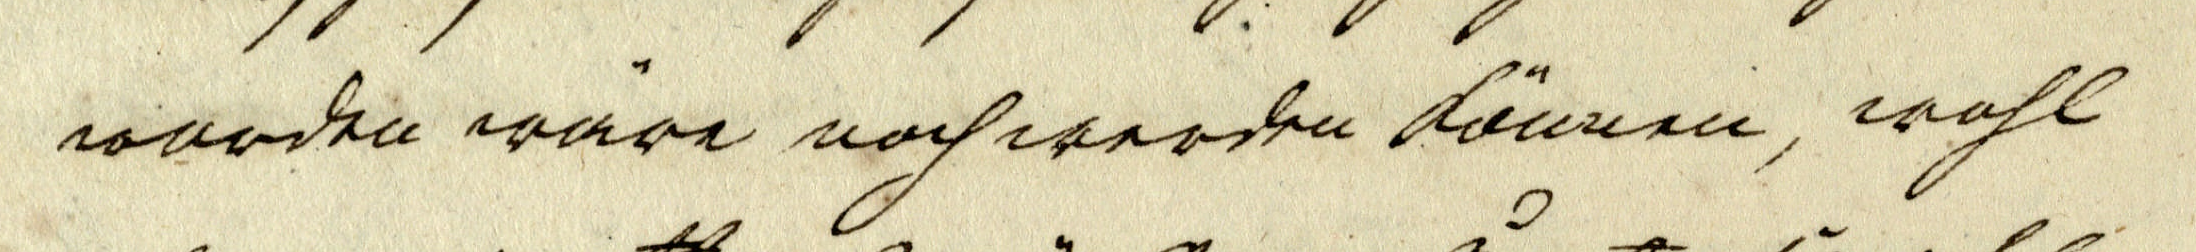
worden wäre noch werden können, wohl
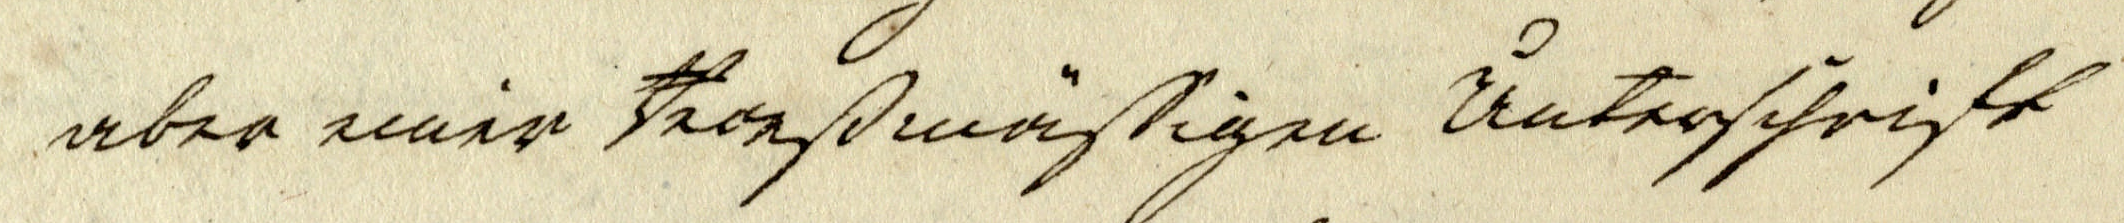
aber einer Receßmässigen Unterschrift
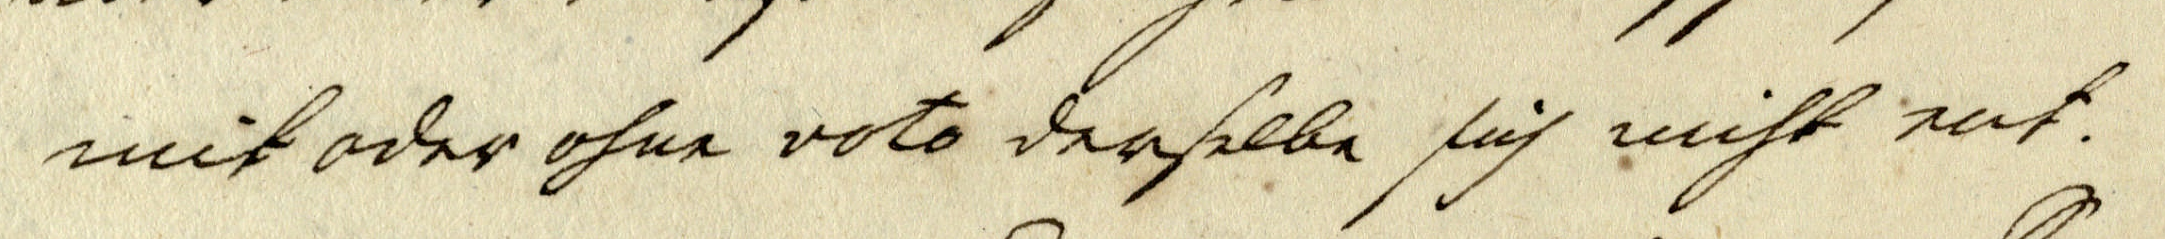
mit oder ohne voto derselbe sich nicht ent¬
